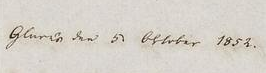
Glarus den 5ten Oktober 1852.
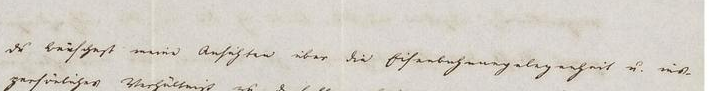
Du wünschest meine Ansichten über die Eisenbahnangelegenheit u. ins-
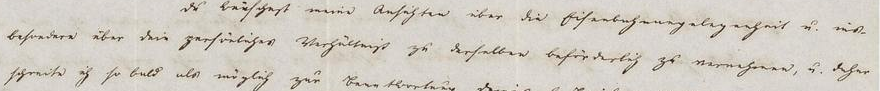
besondere über Dein persönliches Verhältniß zu derselben beförderlich zu vernehmen, u. daher
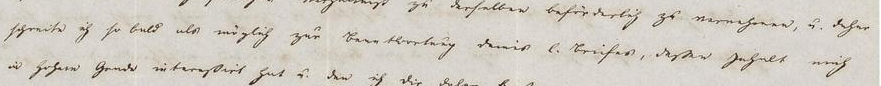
schreite ich so bald als möglich zur Beantwortung Deines l. Briefes, deßen Inhalt mich
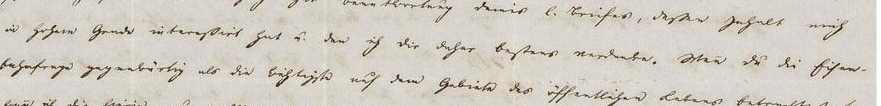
in hohem Grade intereßirt hat u. den ich Dir daher bestens verdanke. Wenn Du die Eisen-
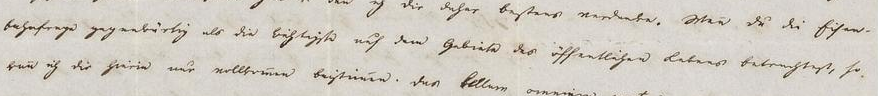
bahnfrage gegenwärtig als die wichtigste auf dem Gebiete des öffentlichen Lebens betrachtest, so
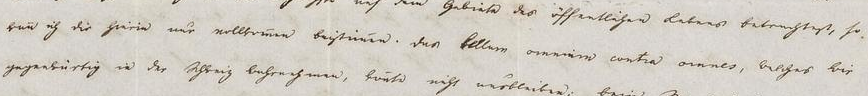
kann ich Dir hierin nur vollkommen beistimmen. Das bellum omnium contra omnes, welches wir
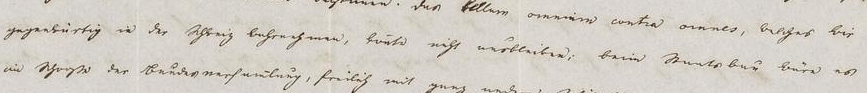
gegenwärtig in der Schweiz wahrnehmen, konnte nicht ausbleiben; beim Staatsbau wäre es
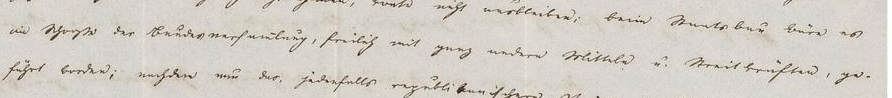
im Schooße der Bundesversammlung, freilich mit ganz andern Mitteln u. Streitkräften, ge-
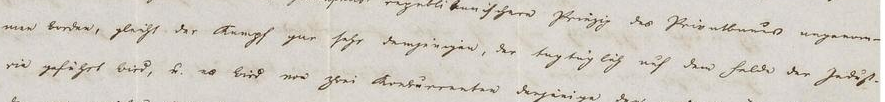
men worden, gleicht der Kampf gar sehr demjenigen, der tagtäglich auf dem Felde der Indust-
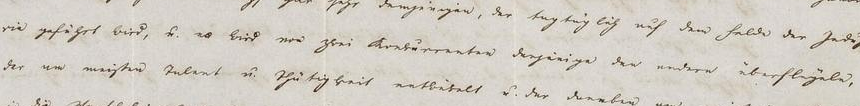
rie geführt wird, u. es wird von zwei Konkurrenten derjenige den andern überflügeln,
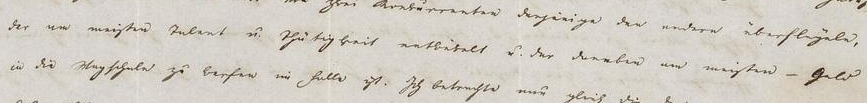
der am meisten Talent u. Thätigkeit entwickelt u. der daneben am meisten – Geld
